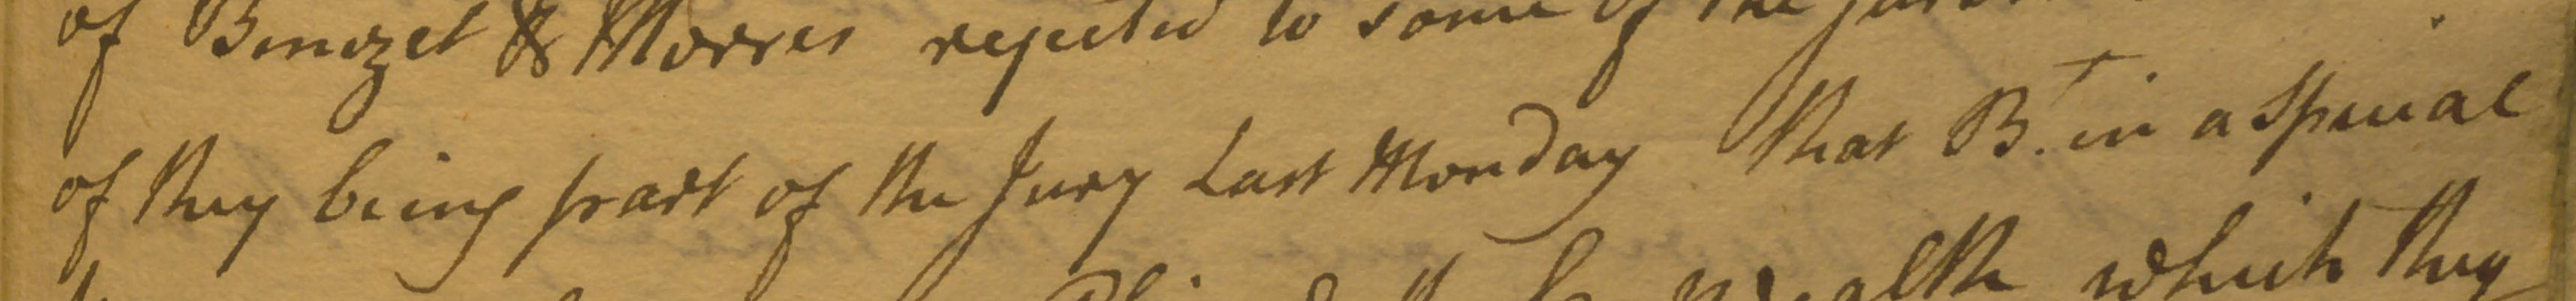of they being part of the Jury Last Monday that B^t. in a special
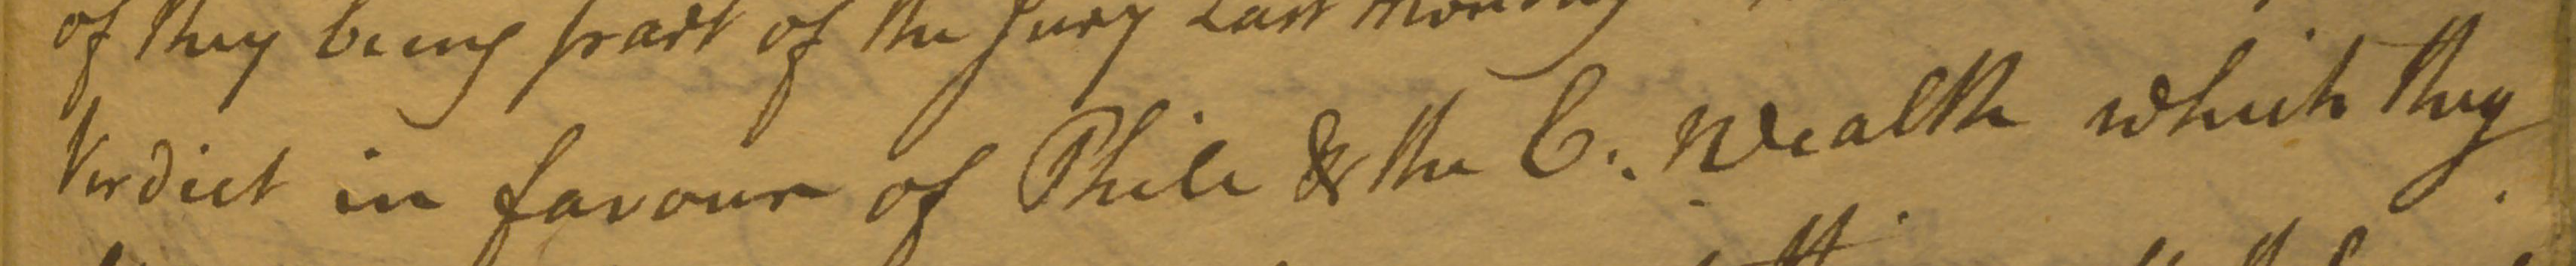Verdict in favour of Phile & the C. Wealth which they
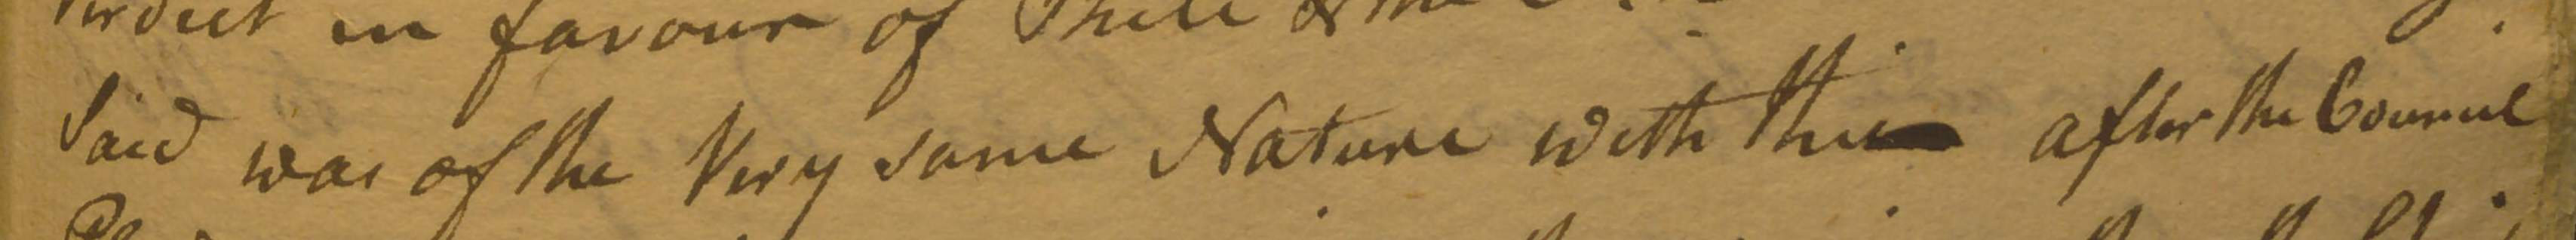said was of the Very same Nature with this after the Council
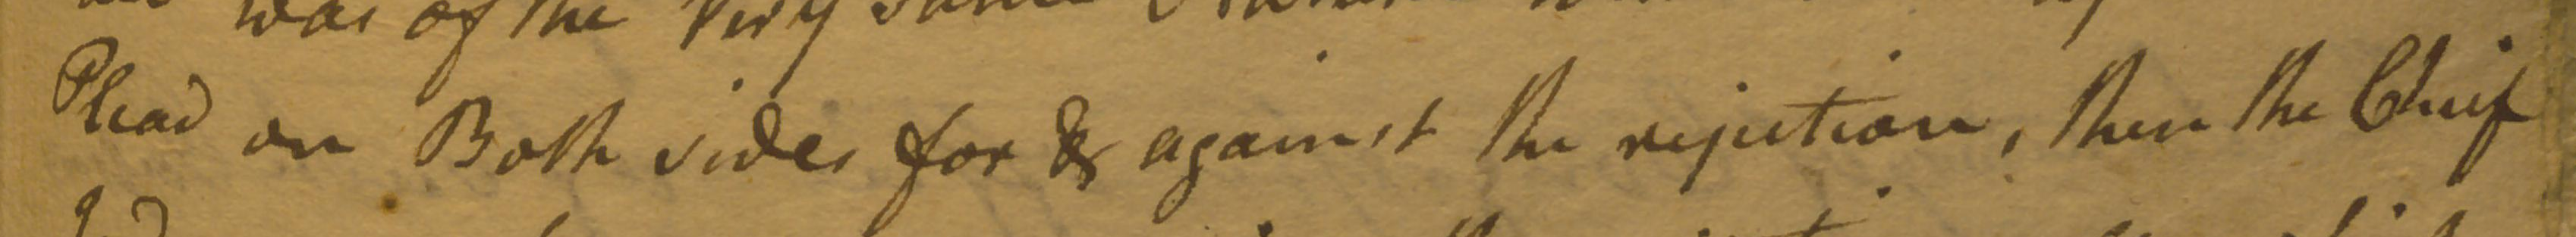Plead on Both sides for & against the rejection, then the Chief
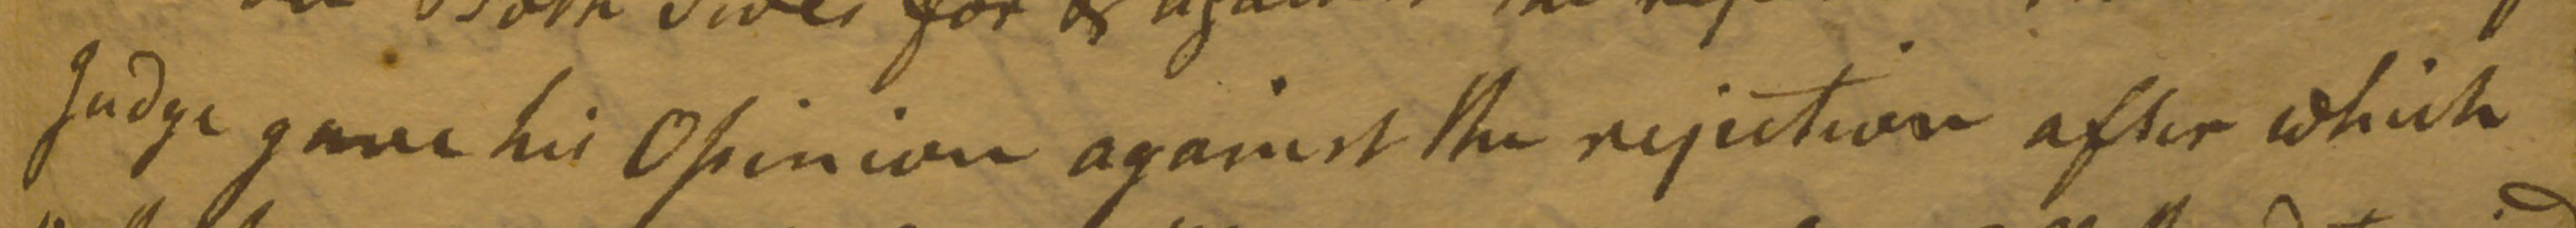Judge gave his opinion against the rejection after which
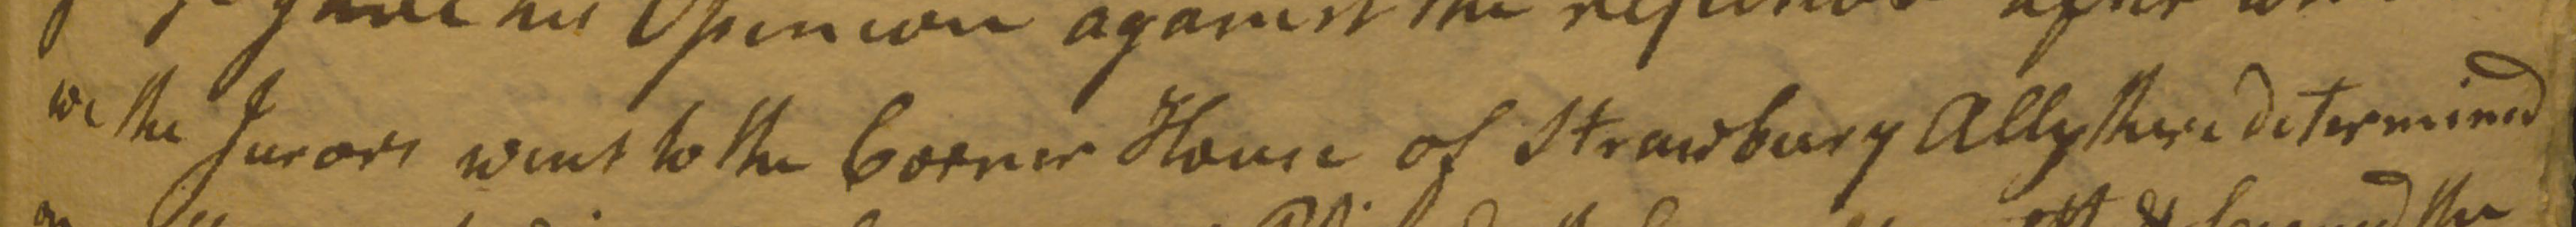we the Jurors went to the Corner House of Strawberry Ally there determined
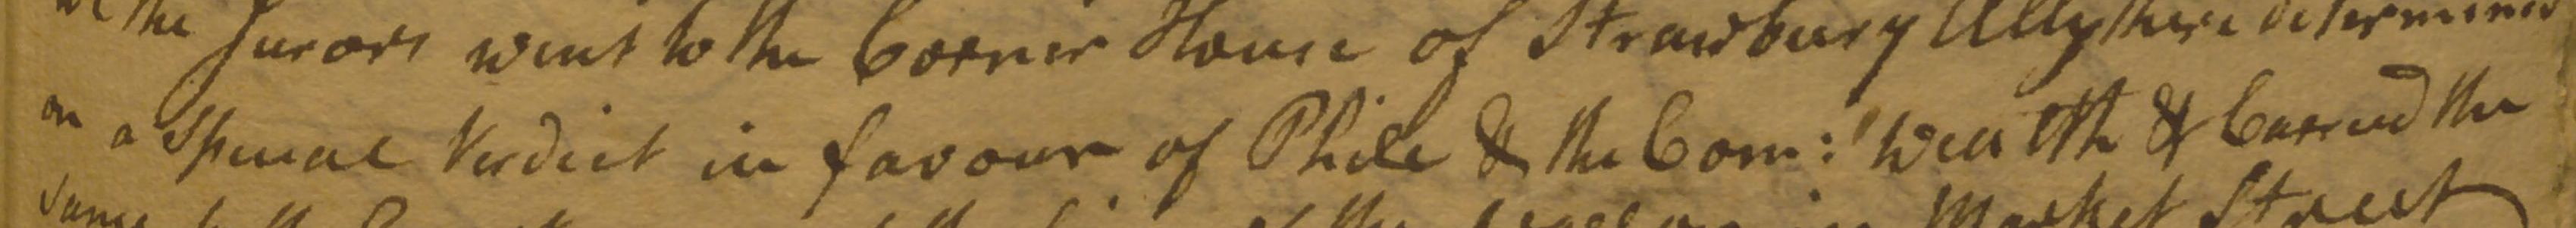in e special Verdict in favour of Phile & the Com: weal th & Carried the
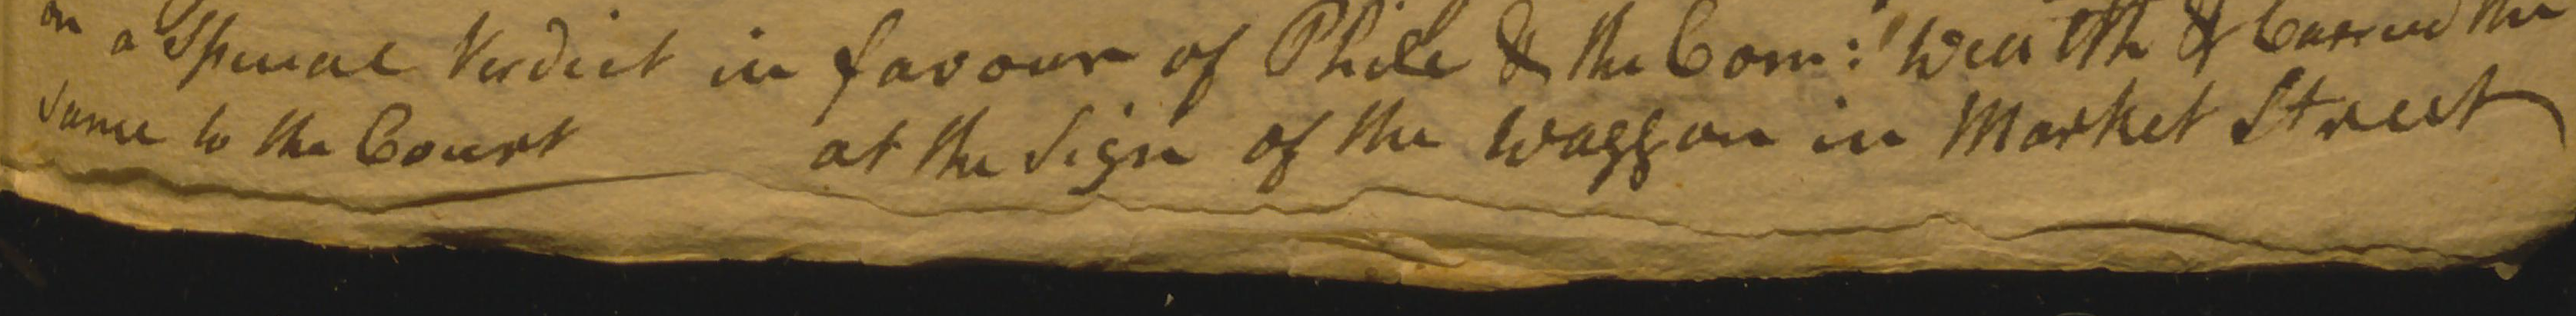same to the Court- at the sign of the waggon in Market Street
